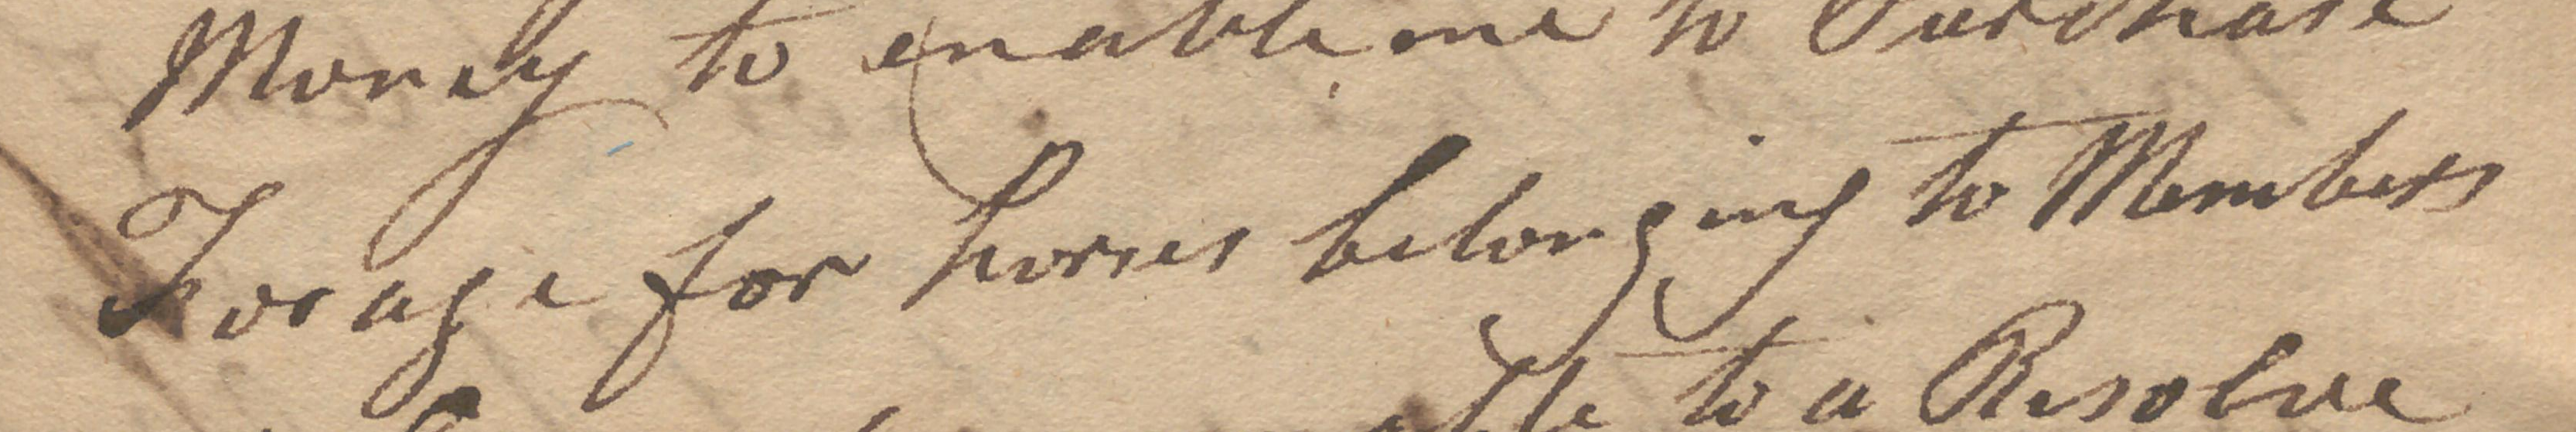Forage for horses belonging to Members
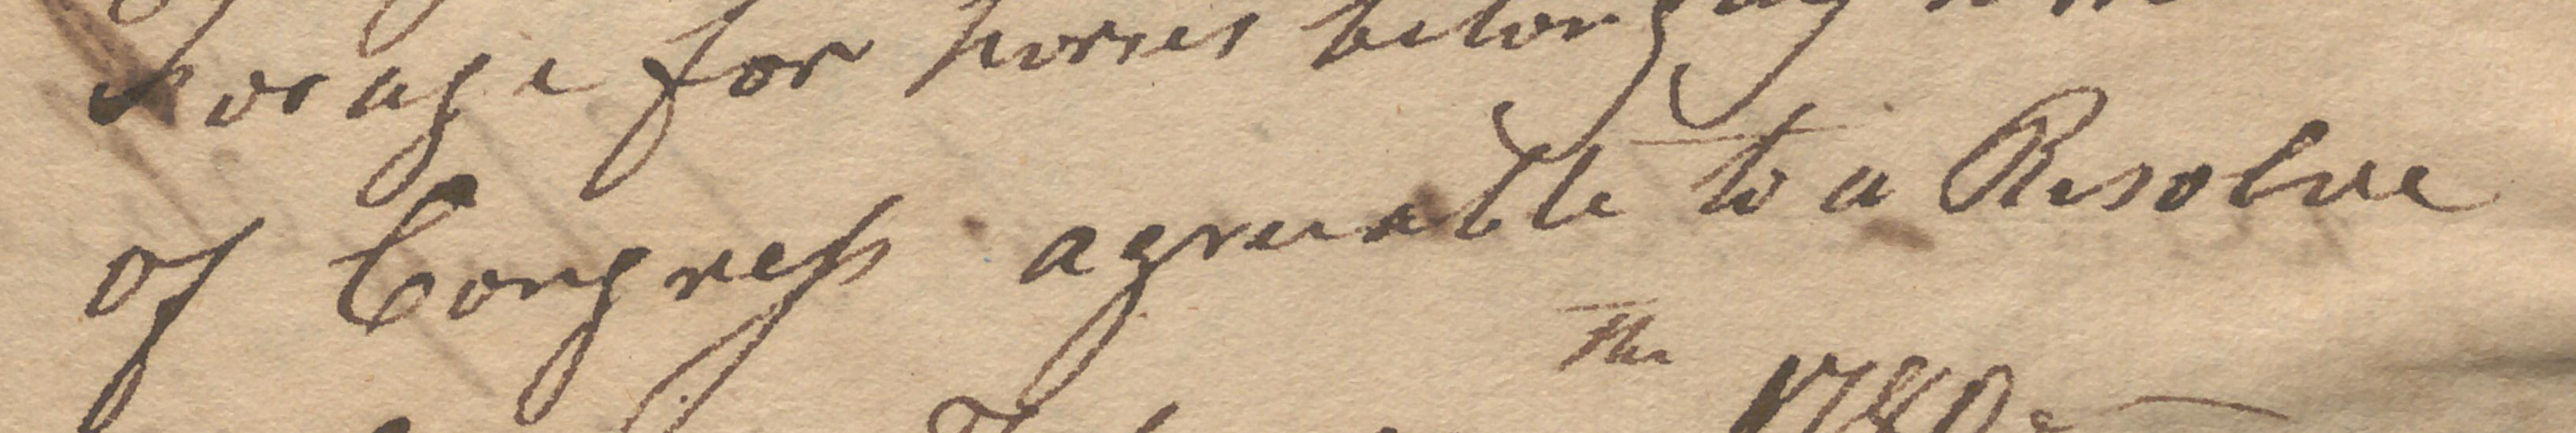Congress agreeable to a Resolve
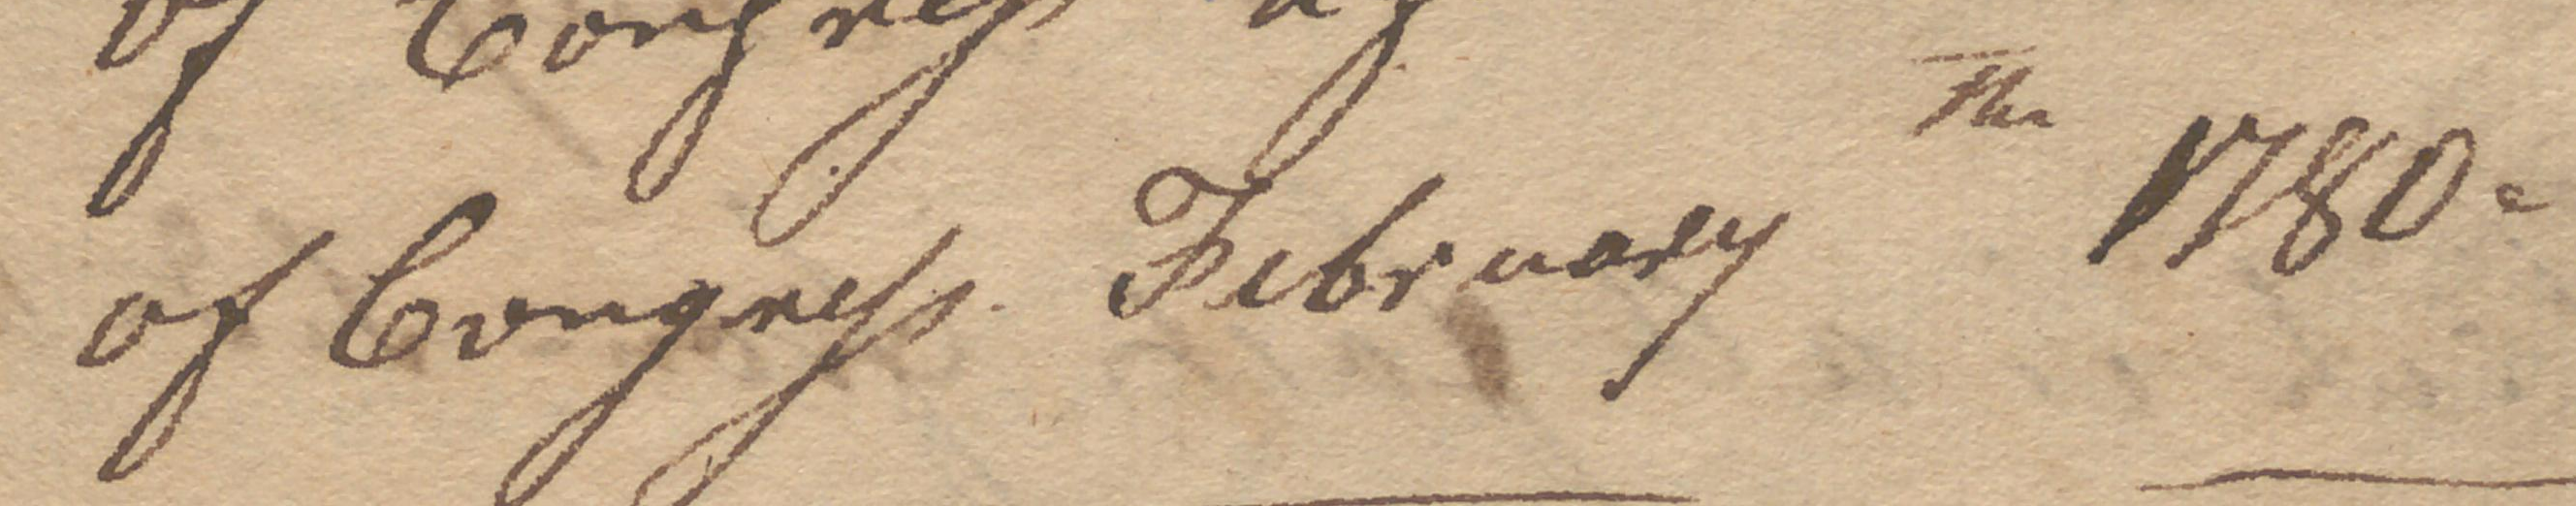of Congres February 1780
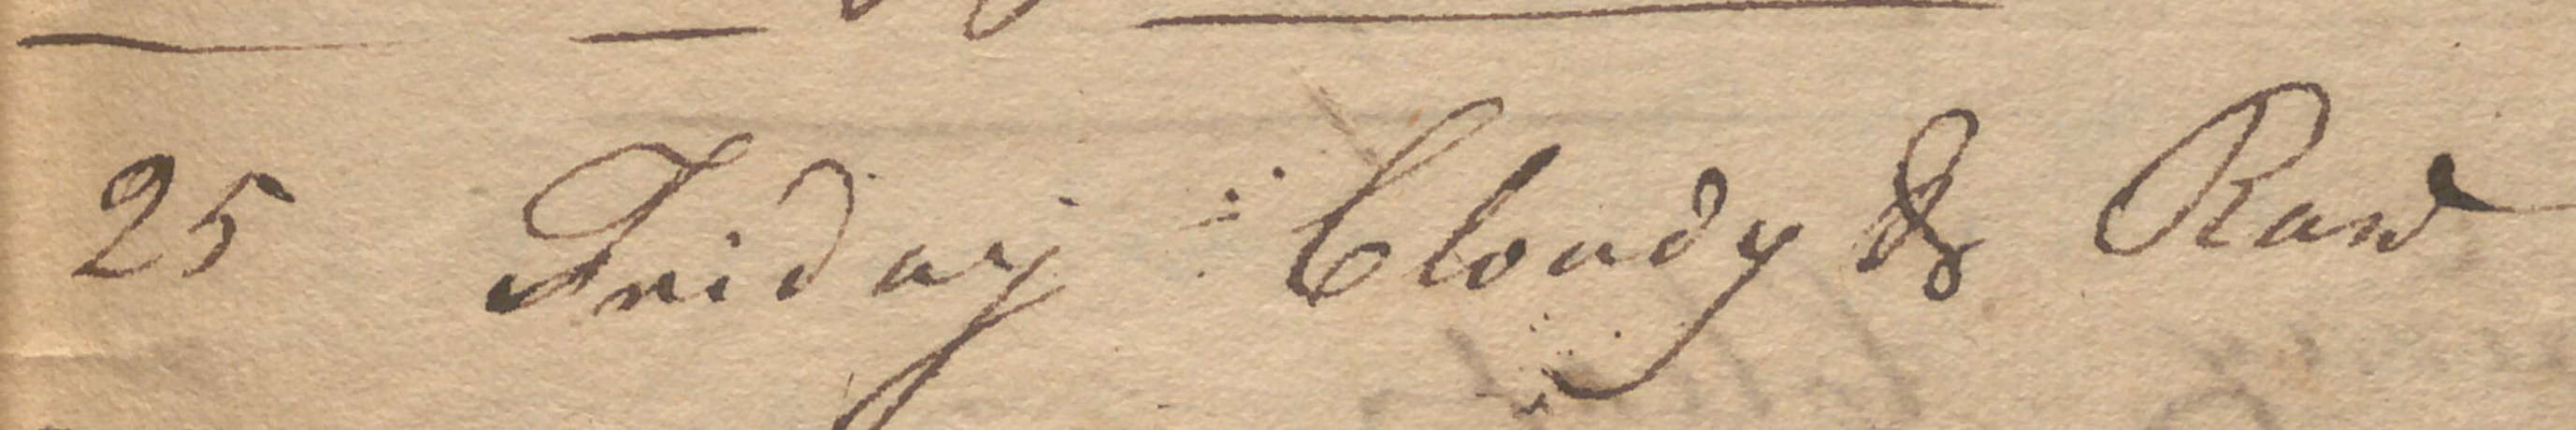25 Friday. Cloudy & Raw
